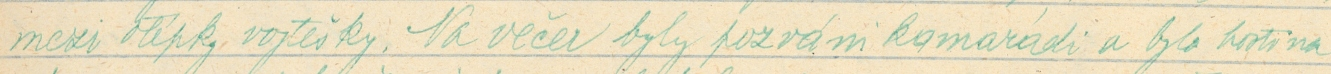mezi otépky vojtešky. Na večer byly pozváni kamarádi a byla hostina.
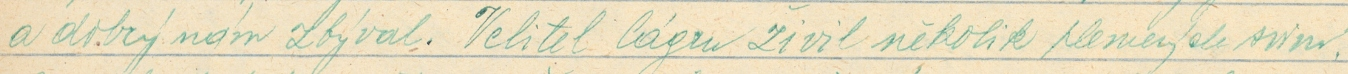a dobrý nám zbýval. Velitel lágru živil několik plemených sviní.
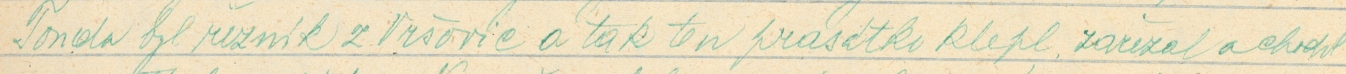Tonda byl řezník z Vršovic a tak ten prasátko klepl, zařezal a chodil
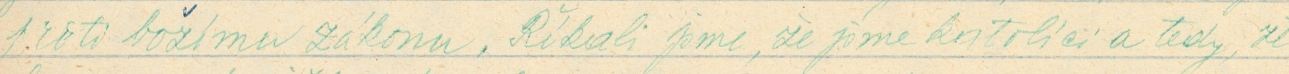proti božímu zákonu. Říkali jsme, že jsme katolíci a tedy, že
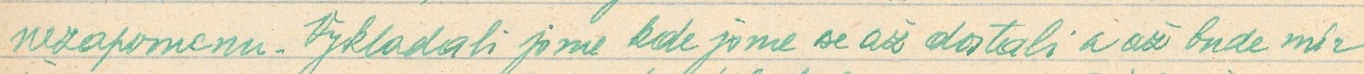nezapomenu. Vykladali jsme kde jsme se až dostali a až bude mír
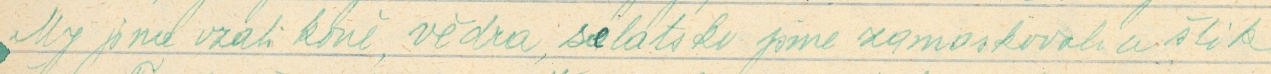My jsme vzali koně, vědra, selatsko jsme zamaskovali a šli k
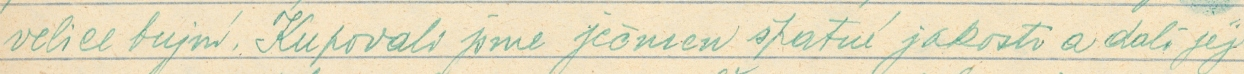velice bujní. Kupovali jsme ječmen špatné jakosti a dali jej
